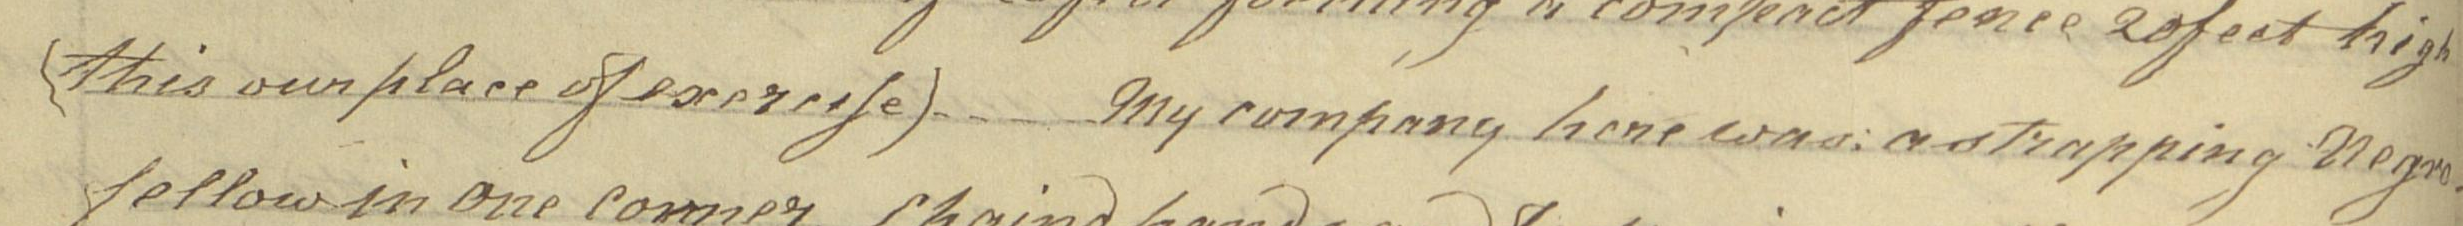(this our place of exercise) My company here was a strapping Negro
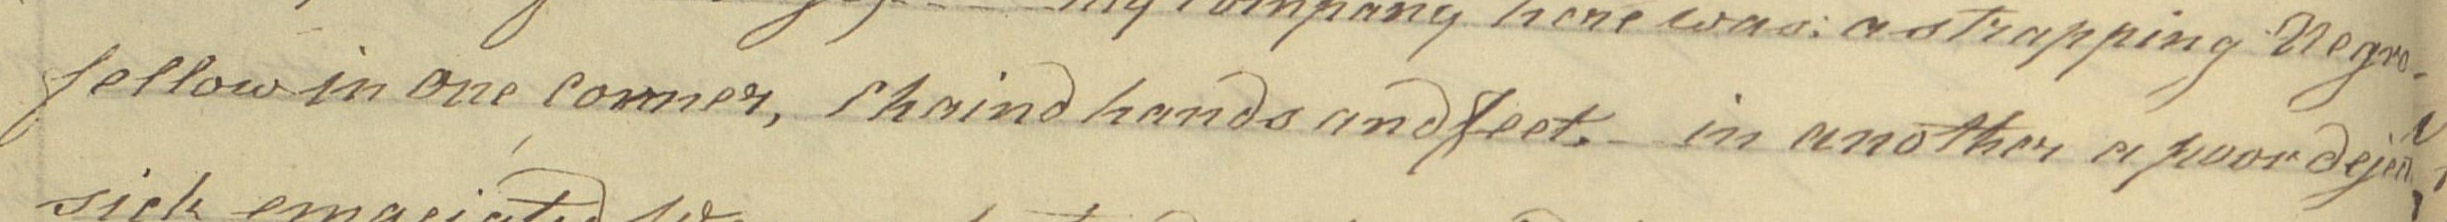fellow in one corner, chaind hands and feet- in another a poor deject-
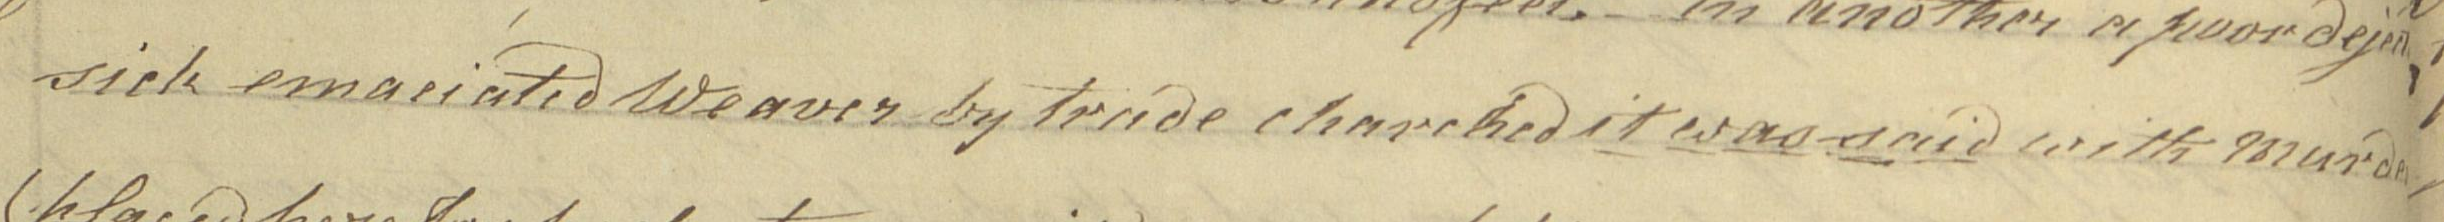sick emaciated Weaver by trade charched it was said with murde-
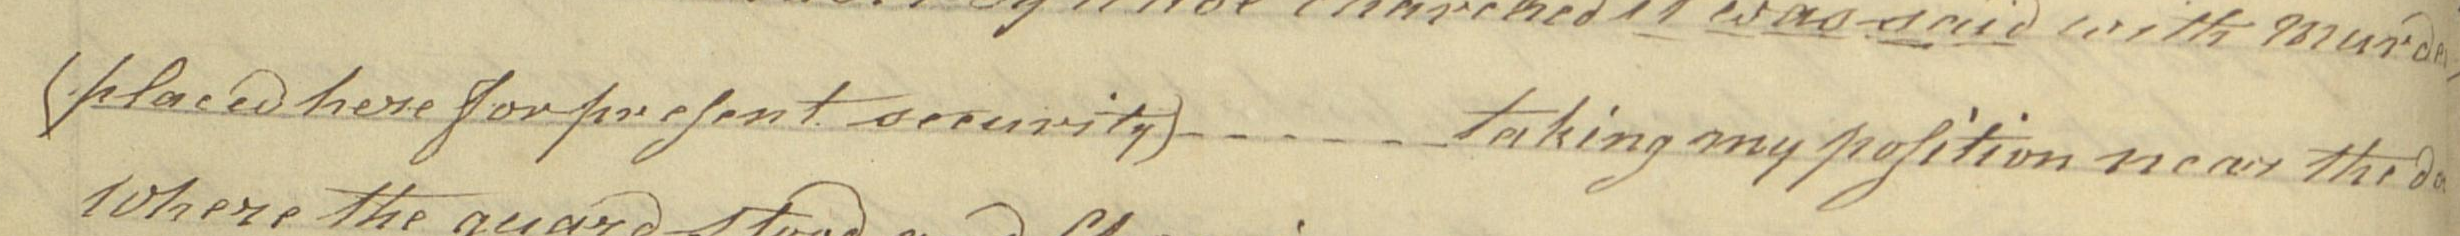(placed here for present security) taking my position near the do-
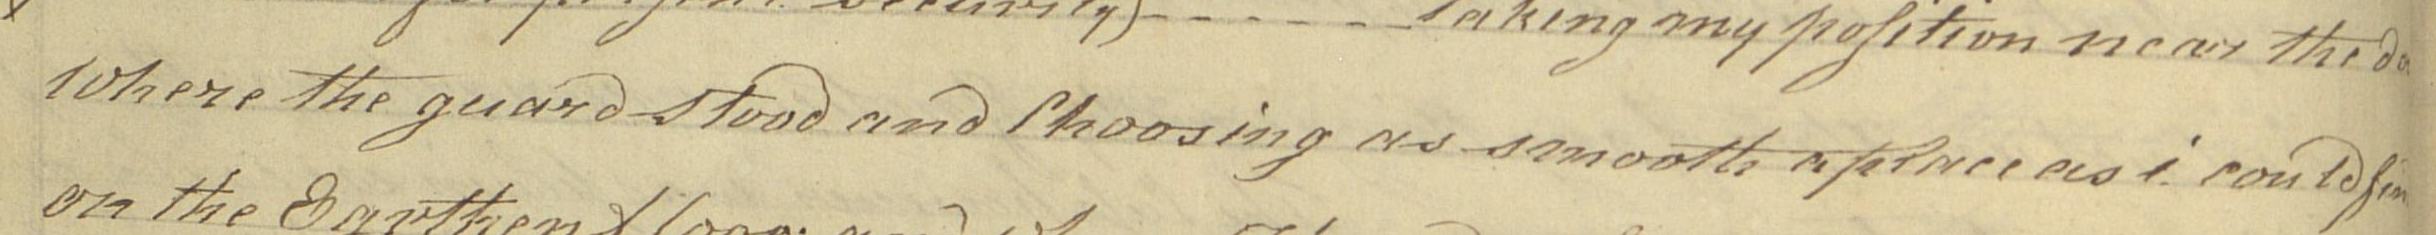where the guard stood and Choosing as smooth a place as i could fin-
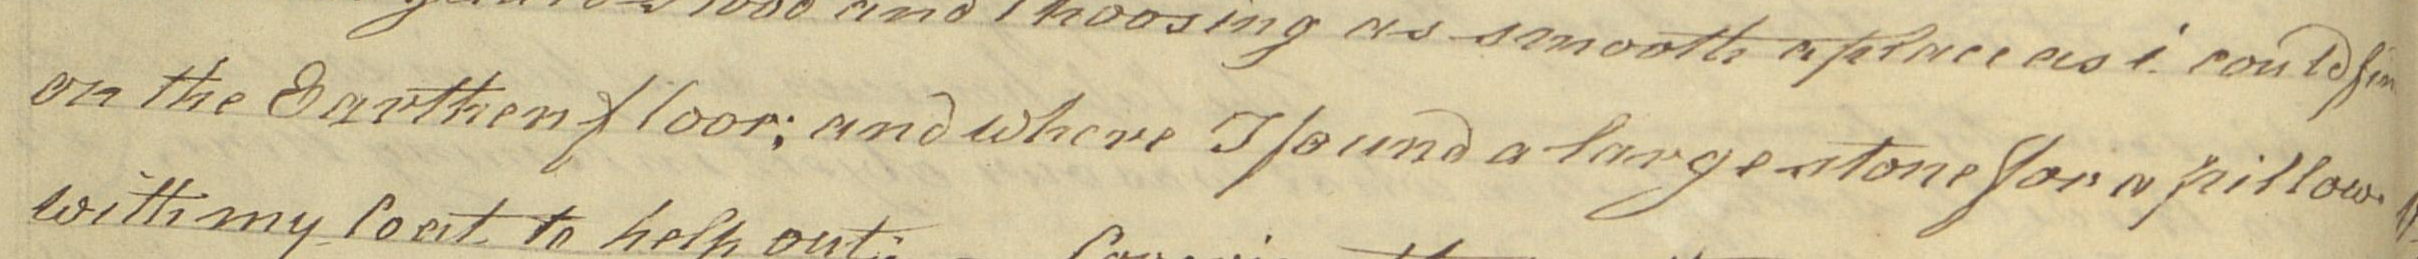on the Earthen floor and where I found a large stone for a pillow
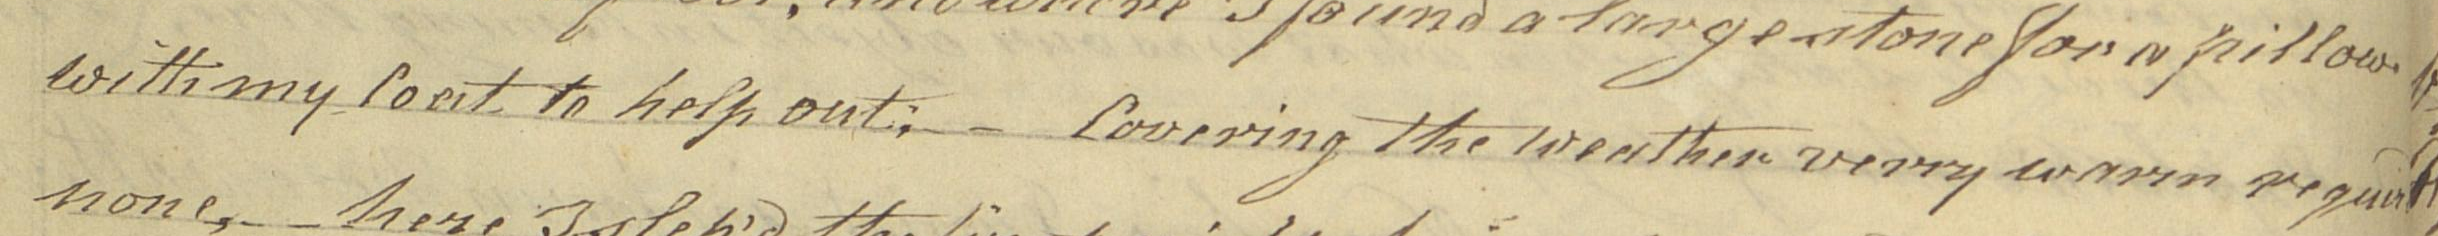with my Coat to help out; Covering the weather verry warm requird
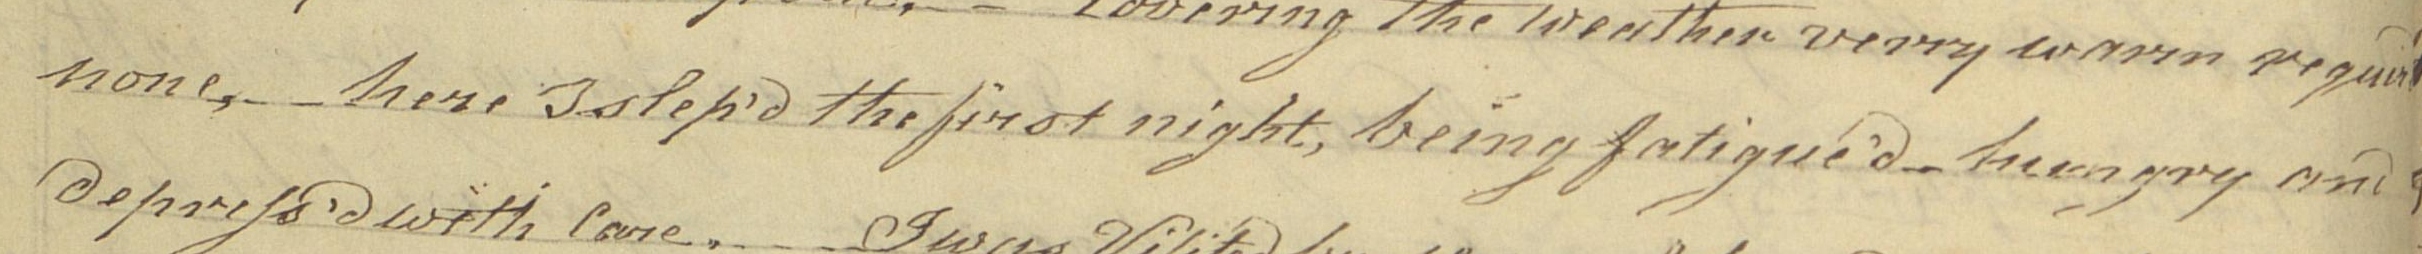none, here I slep'd the first night being fatigue'd, hungry and
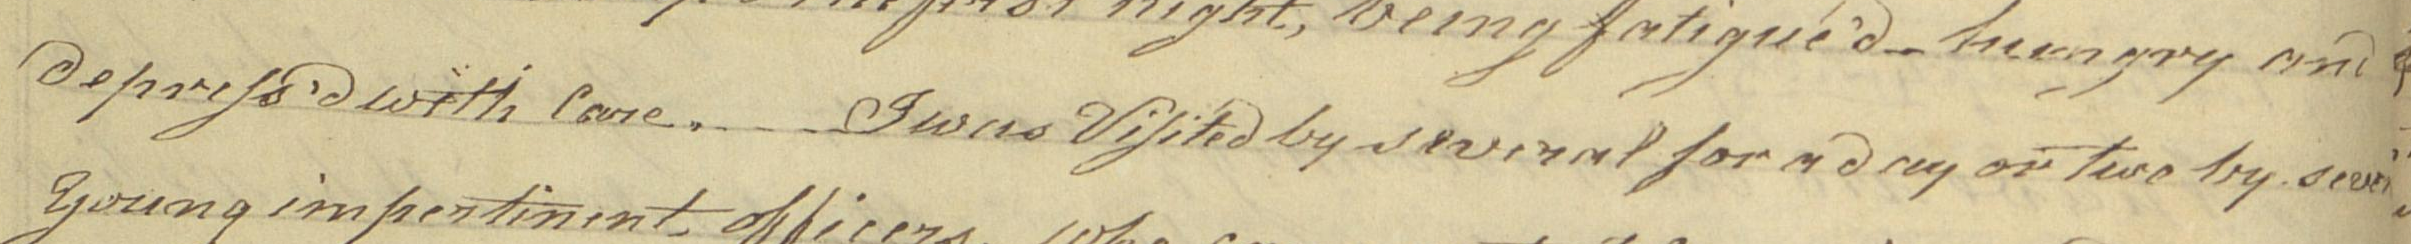depress'd with Care. I was Visited by several for a day or two by sever-
